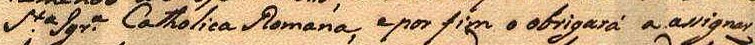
s.ta Igr.a Catholica Romana, e por fim o obrigará a assignar
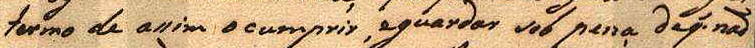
termo de assim o cumprir, e guardar sob pena de q̄ naõ
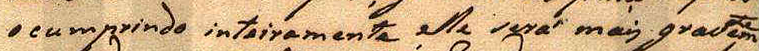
o cumprindo inteiramente elle será mais gravem.te
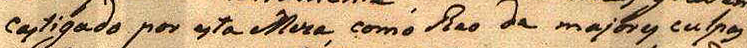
castigado por esta Meza como Reo de maiores culpas
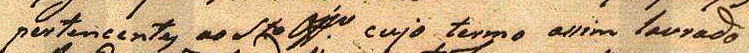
pertencentes ao s.to Off.o cujo termo assim lavrado
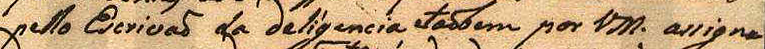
pello Escrivaõ da deligencia taõbem por VM. assigna
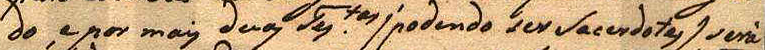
do, e por mais duas Tes.tas /podendo ser sacerdotes/ será
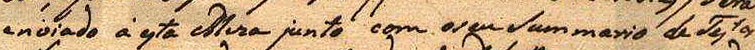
enviado a esta Meza junto com o seu Summario de Tes.tas
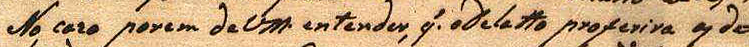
No cazo porem de VM entender, q̄ o Delatto proferira as de
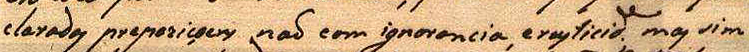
claradas prepoziçoens, naõ com ignorancia, e rusticid.de mas sim
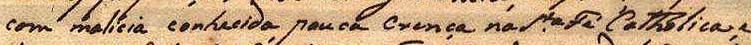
com malicia conhecida, pouca crença na s.ta Fé Catholica, e
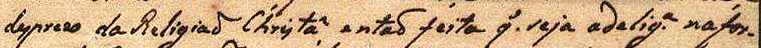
desprezo da Religiaõ Christã, então feita q̄ seja a delig.a na for
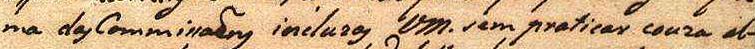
ma das Commissoẽns incluzas, VM. sem praticar couza al
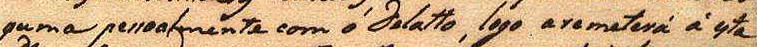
guma pessoalmente com o Delatto, logo a remeterá á esta
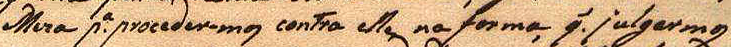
Meza p.a procederemos contra elle na forma, q̄ julgarmos
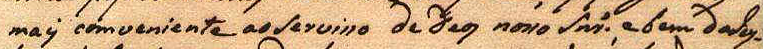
mais comveniente ao servisso de Deos nosso Snr̄., e bem da Ius
